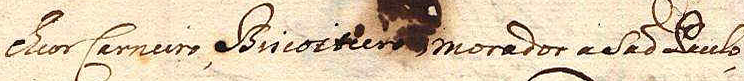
chior Carneiro, Biscoiteiro, morador a Saõ Paulo,
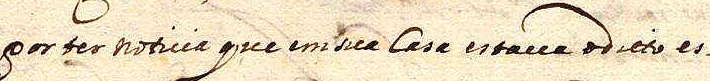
por ter noticia que em sua Casa estaua o ditto es
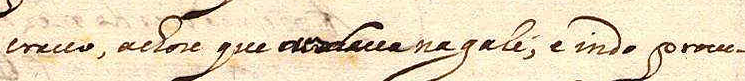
crauo, achou que a_daua na galé, e indo procu
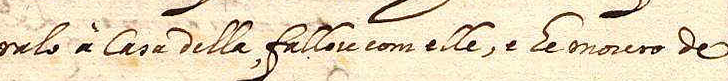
ralo à Casa della, fallou com elle, e he mouro de
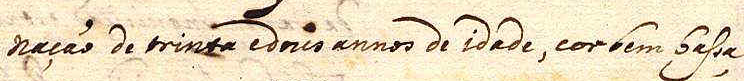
naçaõ de trinta e dous annos de idade, cor bem bassa,
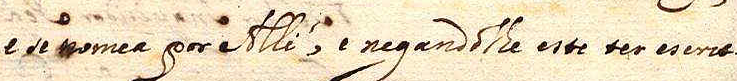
e se nomea por Alli, e negandolhe este ter escrit
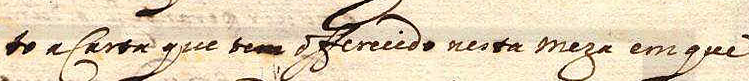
to a Carta que tem offerecido nesta meza em que
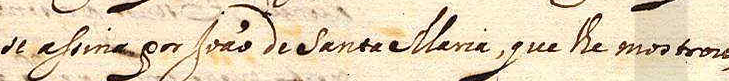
se assina por Joaõ de Santa Maria, que lhe mostrou,
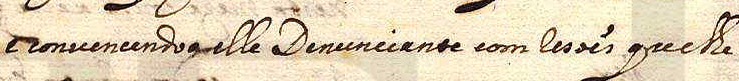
e conuencendoo elle Denunciante com Resoẽs que lhe
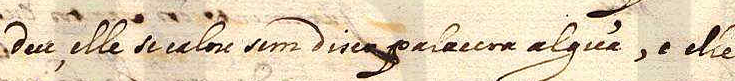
deu, elle se calou sem diser palaura alguā, e elle
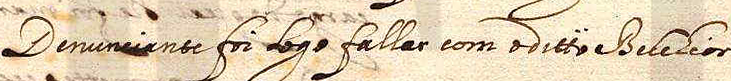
Denunciante foi Logo fallar com o ditto Belchior
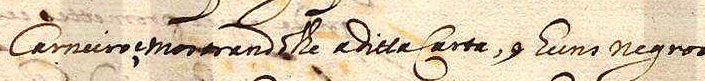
Carneiro, e mostrandolhe a ditta Carta, e huns negros
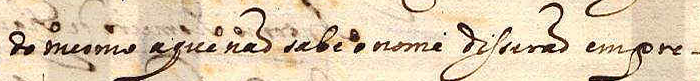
do mesmo a que naõ sabe o nome disseraõ em pre
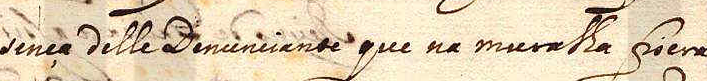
sença delle Denunciante que na muralha fisera
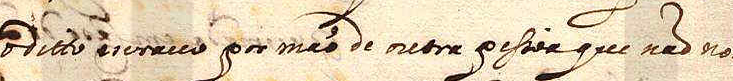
o ditto escrauo por maõ de outra pessoa que naõ no
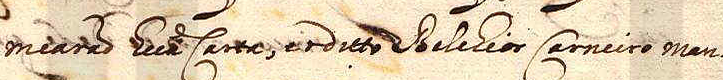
mearaõ huā Carta, e o ditto Belchior Carneiro man
